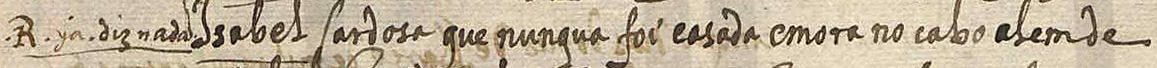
Isabel Cardosa que nunqua foi casada e mora no cabo alem de
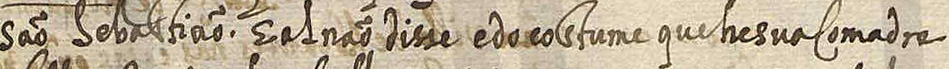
são Sebastião. E al não disse e do costume que sua Comadre
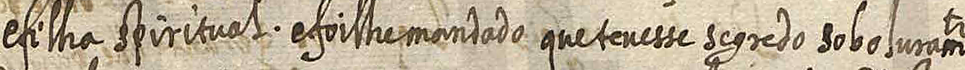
e filha spiritual. e foilhe mandado que teuesse segredo sob o Iuramto
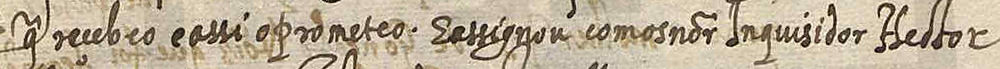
q̄ reçebeo e assi o prometeo. E assignou com o snōr Inquiridor Hector
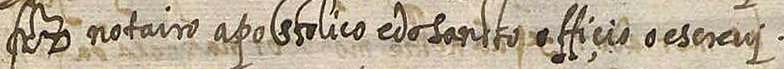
fr̄z notairo apostolico e do sancto offiçio o escreuj.
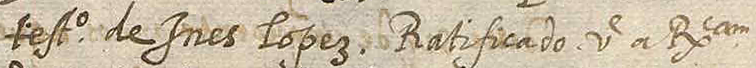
test.o de Jnes lopez . Ratificado ve a ℞cam
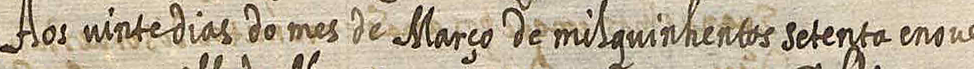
Aos uinte dias do mes de Março de mil quinhentos setenta e noue
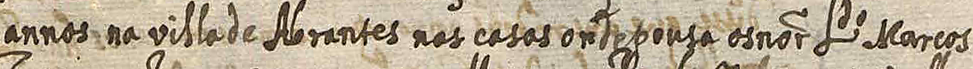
annos na villa de Abrantes nas casas onde pousa o snor̄ Ldo Marcos
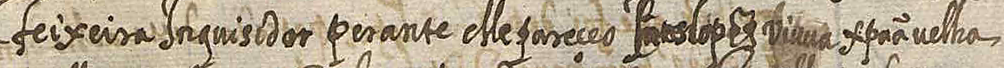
Teixeira Inquisidor perante elle pareçeo Jnes lopes̄ viuva xpaā uelha
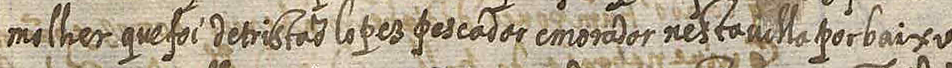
molher que foi de tristão lopez pescador e morador nesta uilla por baixo
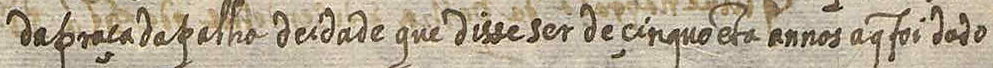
da praça da palha de idade que disse ser de çinquoēta annos a q̄ foi dado
